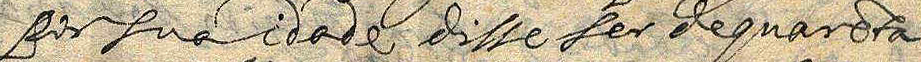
por sua idade disse ser de quarēta
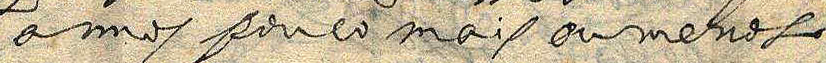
annos pouco mais ou menos
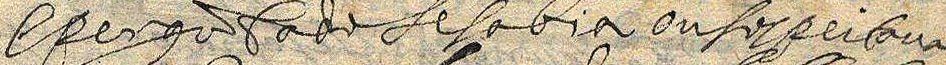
e pergūtado se sabia ou sospeitaua
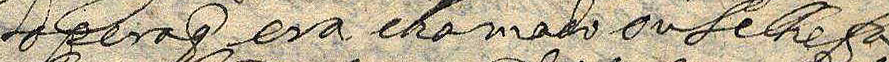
o pera q̄ era chamado ou se lhe fa
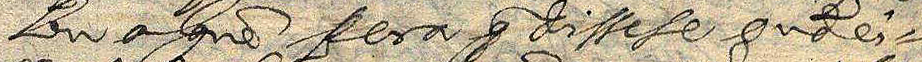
lou alguē pera q̄ dissese ou dei
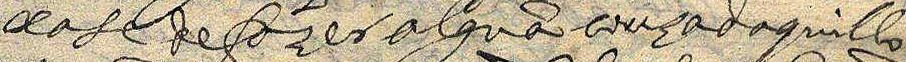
xase de fazer alguā couza daquillo
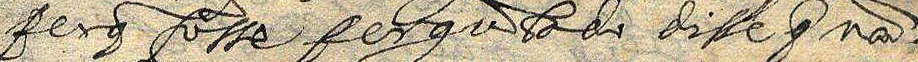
per q̄ fosse pergūtado disse q̄ não
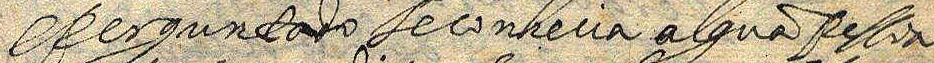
e perguntado se conhecia alguā pessoa
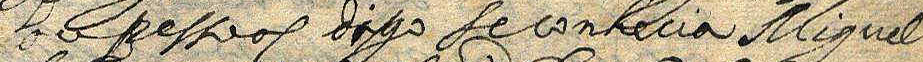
ou pessoas digo se conhecia Miguel
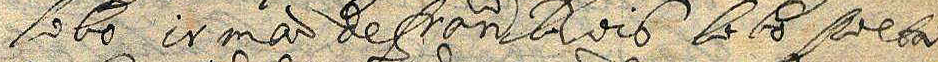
lobo irmão de franco Rois̄ lobo poeta
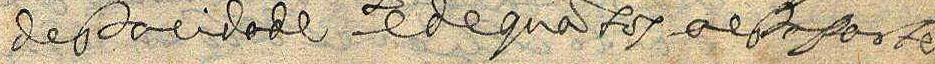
desta cidade e de quātos a esta parte
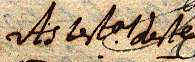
As test.as deste
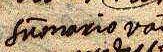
sūmario vaõ
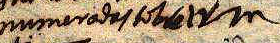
numeradas sobre
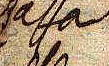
1.a tta
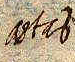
aetas
